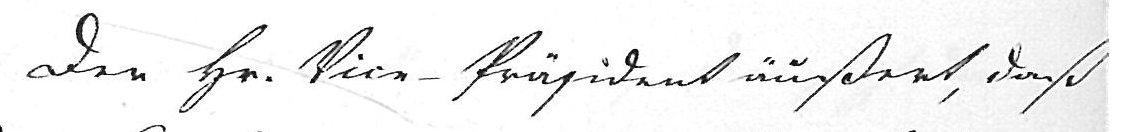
Der Hr. Vice-Präsident äußert, daß
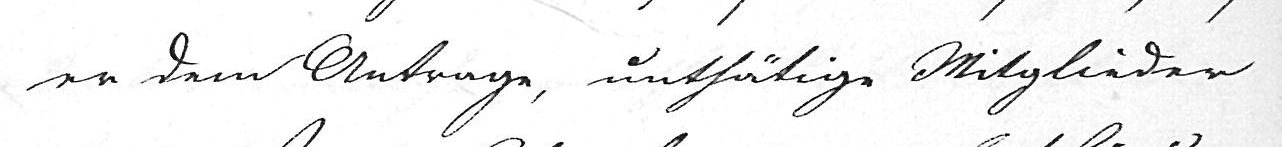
er dem Antrage, unthätige Mitglieder
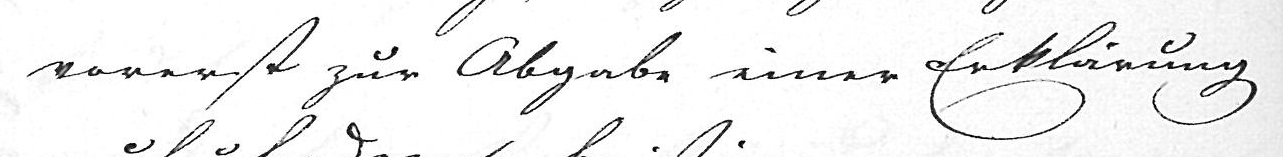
vorerst zur Abgabe einer Erklärung
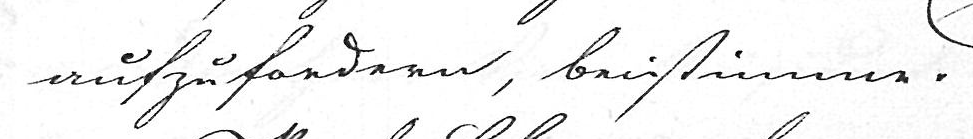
aufzufordern, beistimme.
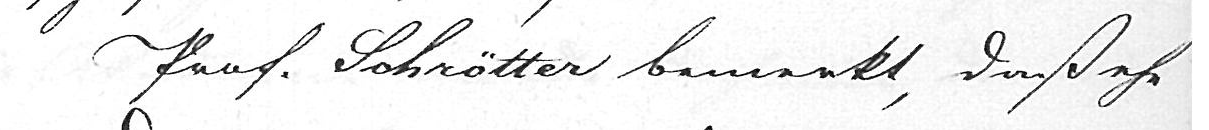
Prof. Schrötter bemerkt, daß ehe
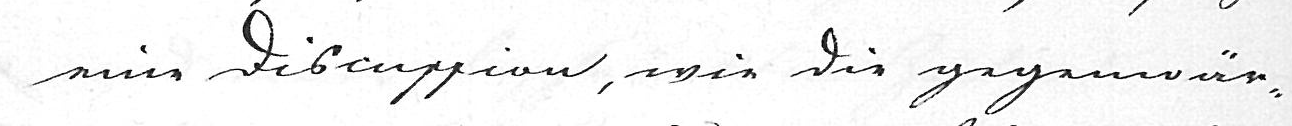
eine Discussion, wie die gegenwär-
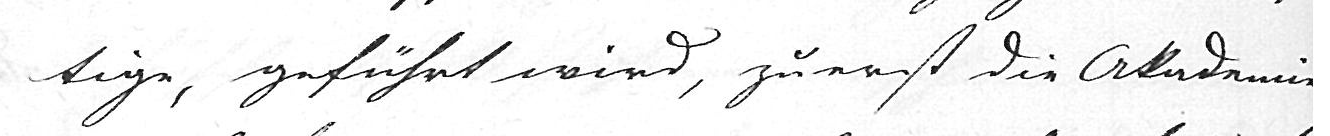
tige, geführt wird, zuerst die Akademie
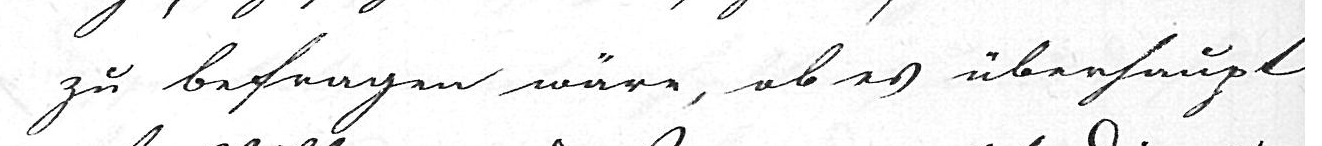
zu betragen wäre, ob es überhaupt
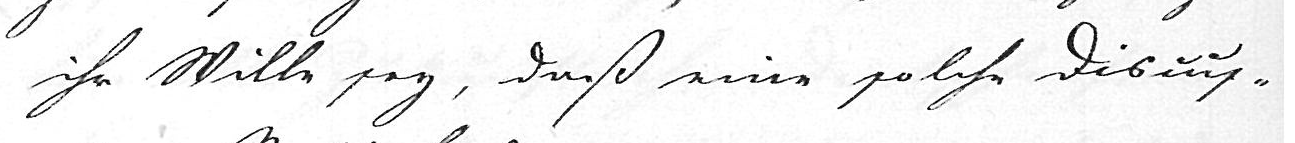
ihr Wille sey, daß eine solche Discus-
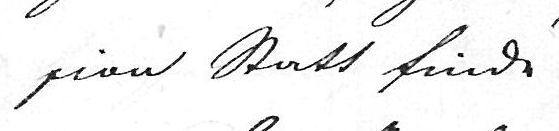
tion Statt finde.
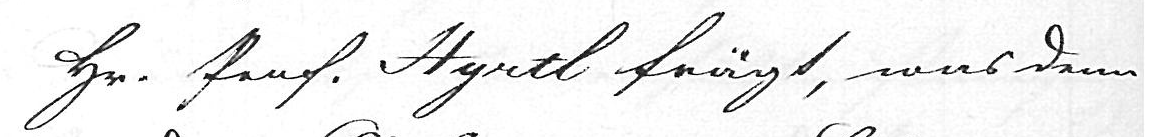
Hr. Prof. Hyrtl fragt, was denn
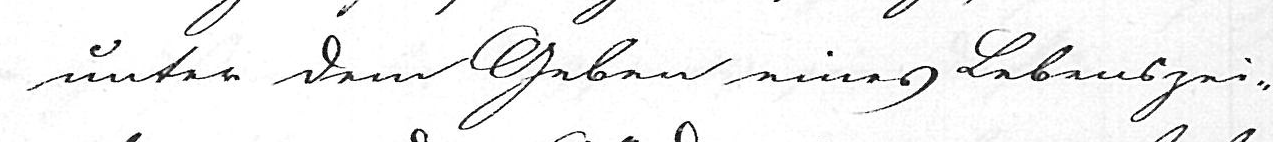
unter dem Geben eines Lebenszei-
